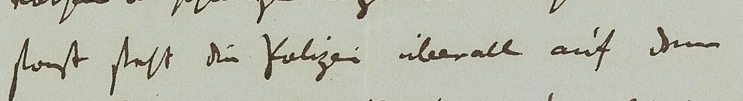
sonst steht die Polizei überall auf dem
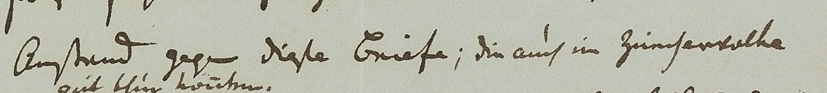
Anstand gegen diese Briefe; die auch im Zürchervolke
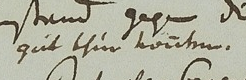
gut thun könnten.
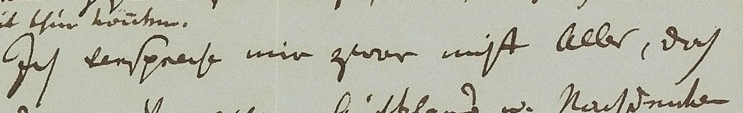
Ich verspreche mir zwar nicht Alles, doch
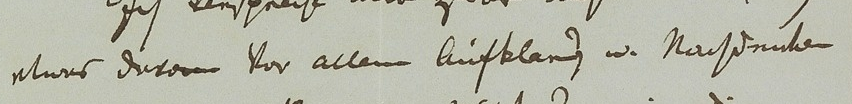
etwas davon. Vor allem Aufklärung u. Nachdenken
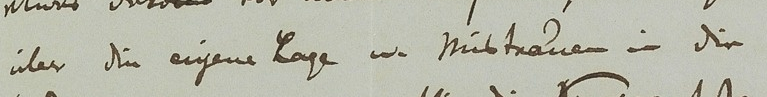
über die eigene Lage u. Mistrauen in die
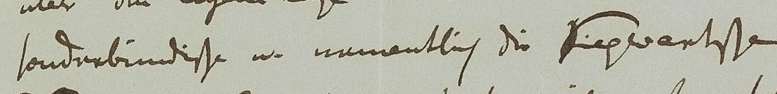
sonderbündische u. namentlich die Siegwartsche
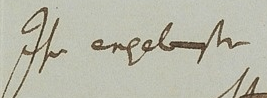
Ihr ergebenster
